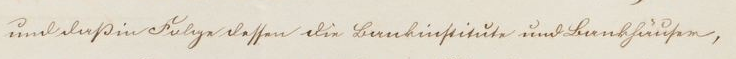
und daß in Folge dessen die Bankinstitute und Bankhäuser
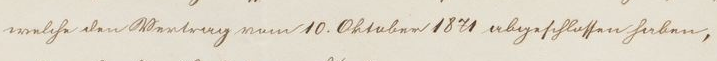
welche den Vertrag vom 10. Oktober 1871 abgeschlossen haben,
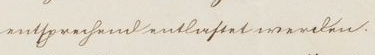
entsprechend entlastet werden.
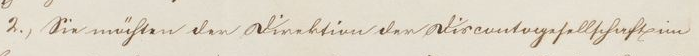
2.) Sie möchten der Direktion der Discontogesellschaft im
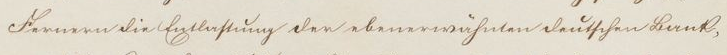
Fernern die Entlastung der ebenerwähnten deutschen Bank-
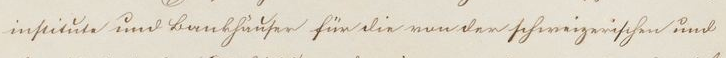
institute und Bankhäuser für die von der schweizerischen und
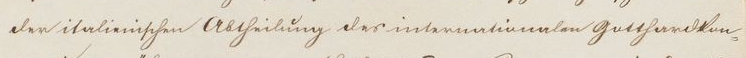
der italienischen Abtheilung des internationalen Gotthardkon-
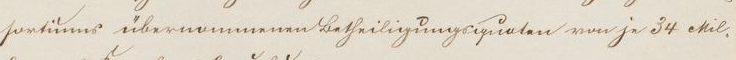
sortiums übernommenen Betheiligungsquoten von je 34 Mil-
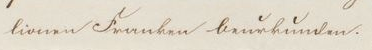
lionen Franken beurkunden.
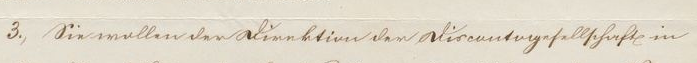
3.) Sie wollen der Direktion der Discontogesellschaft in
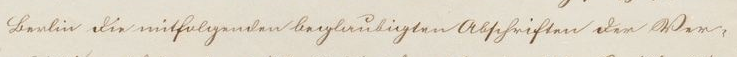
Berlin die mitfolgenden beglaubigten Abschriften der Ver-
